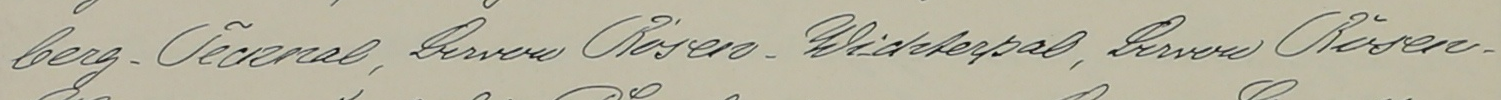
berg-Tecknal, Baron Rosen-Wichterpal, Baron Rosen-
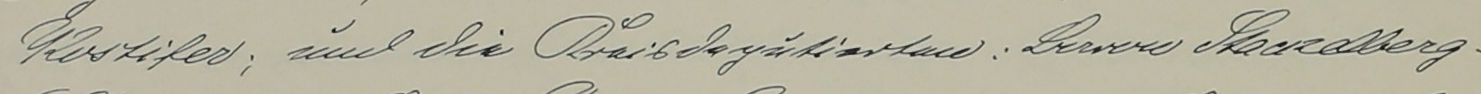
Kostifer; und die Kreisdeputierten: Baron Stackelberg-
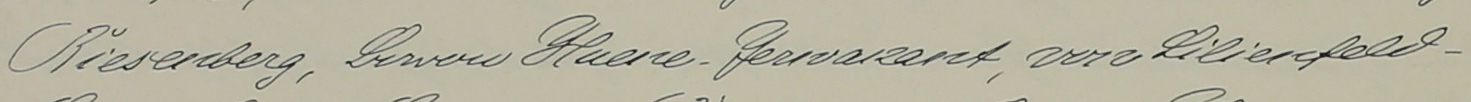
Riesenberg, Baron Huene-Jerwakant, von Lilienfeld-
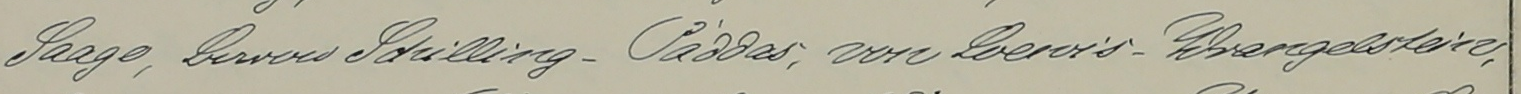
Saage, Baron Schilling-Paddas, von Loewis-Wrangelstein,
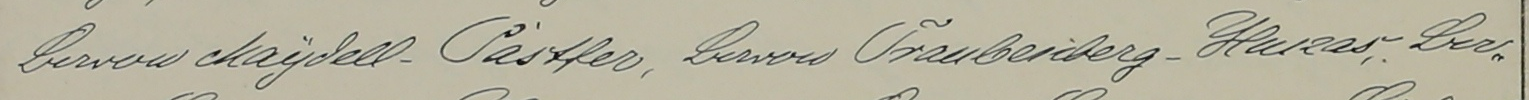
Baron Maydell-Pastfer, Baron Traubenberg-Hukas, Ba-
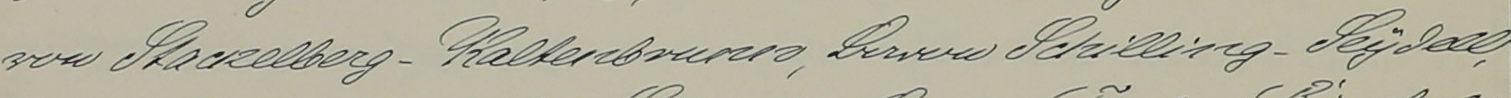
ron Stackelberg-Kaltenbrunn, Baron Schilling-Seydell,
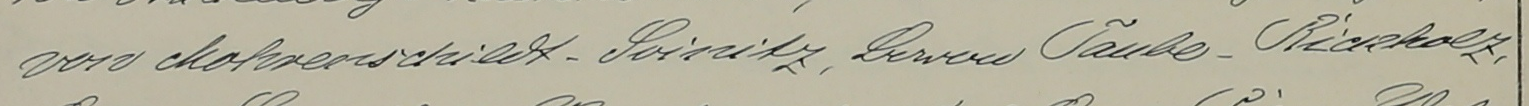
von Mohrenschildt-Soinitz, Baron Taube-Rickholz,
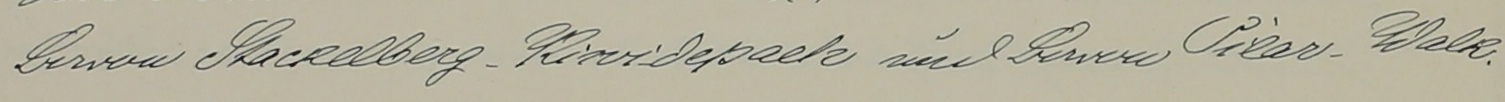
Baron Stackelberg-Kiwidepaeh und Baron Pilar-Walk.
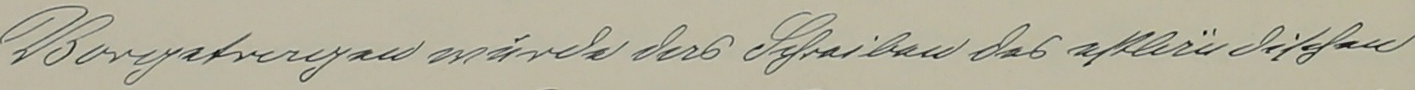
Vorgetragen wurde das Schreiben des estländischen
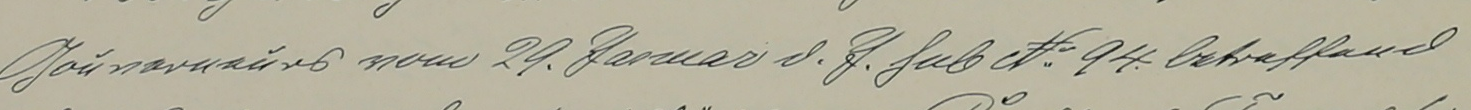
Gouverneurs vom 29. Januar d.J. sub No. 94 betreffend
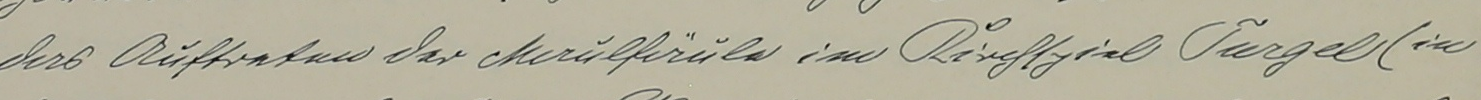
das Auftreten der Maulfäule im Kirchspiel Turgel (in
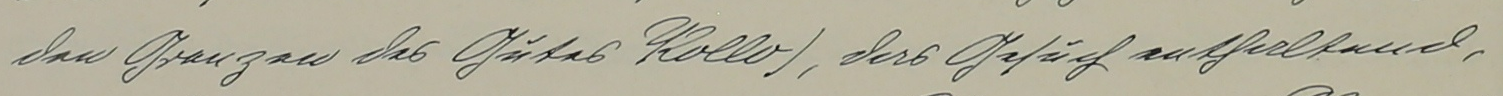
den Grenzen des Gutes Kollo), das Gesuch enthaltend,
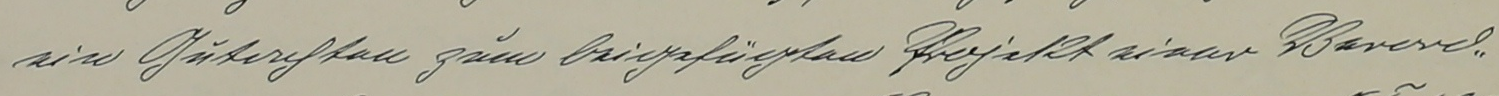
ein Gutachten zum beigefügten Projekt einer Verord-
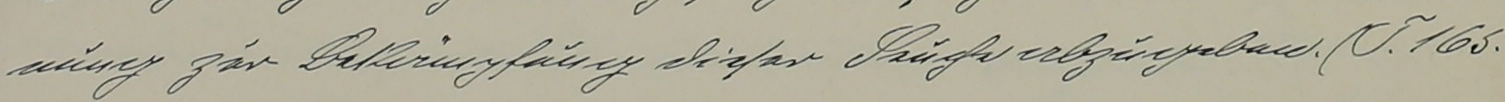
nung zur Bekämpfung dieser Seuche abzugeben. (T.165.
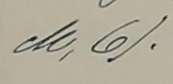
M.6).
